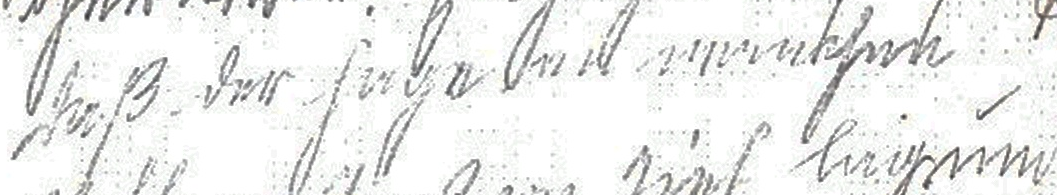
daß der Hagel an manchen
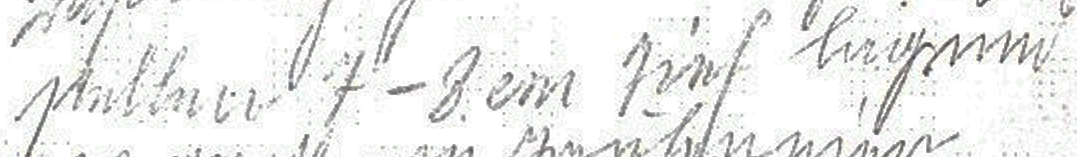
Stellen 7-8 cm tief lag und
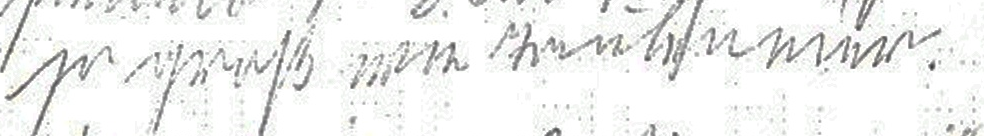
so groß wie Trul??????.
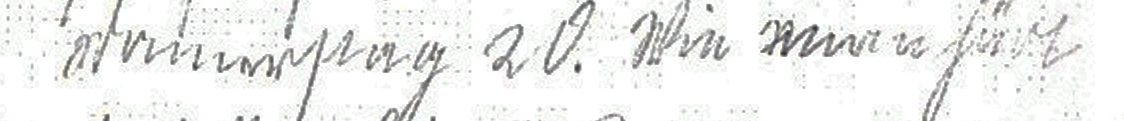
Donnerstag 20. Wie man hört
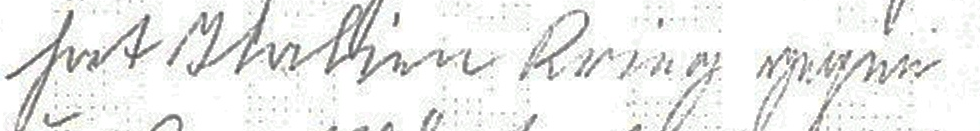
hat Italien Krieg gegen
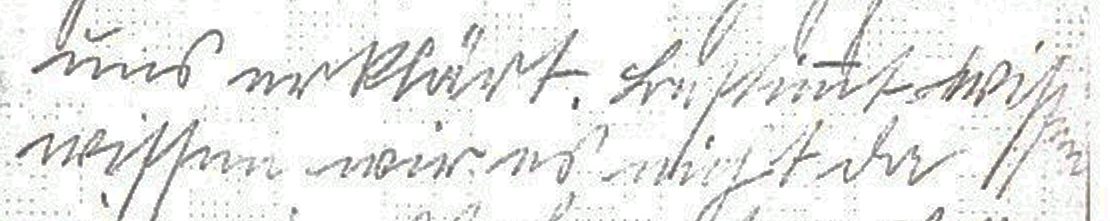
uns erklärt. Bestimmt wissen
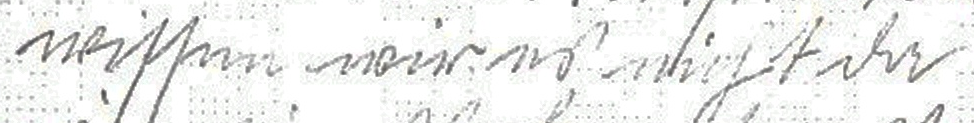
wissen wir es nicht da
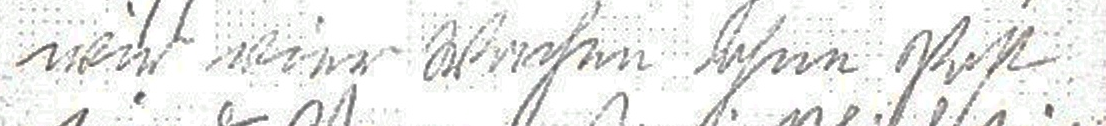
wir eine Woche ohne Post
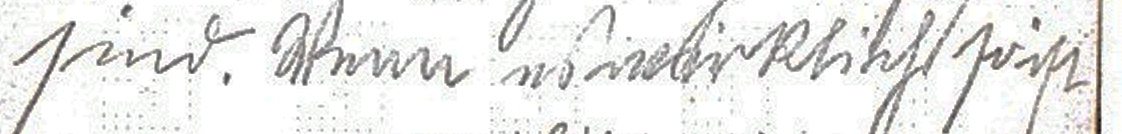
sind. Wenn es wirklich so ist
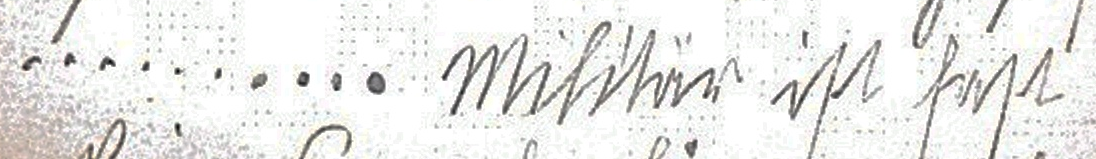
.......... Militär ist fast
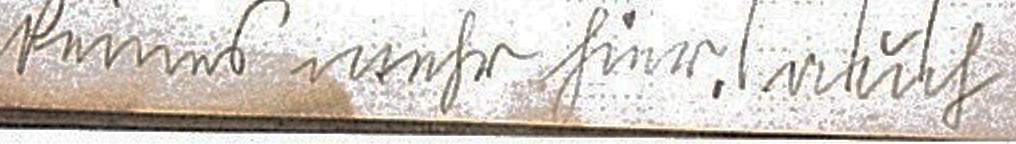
keines mehr hier, auch
